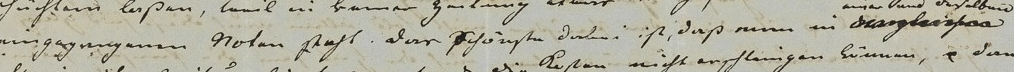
eingegangenen Noten steht. Das Schönste daran ist, daß man in der gleicheneiner
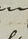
und
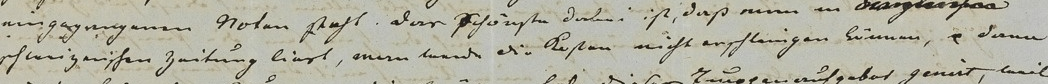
schweizerischen Zeitung liest, man werde die Kosten nicht erschwingen können, u dann
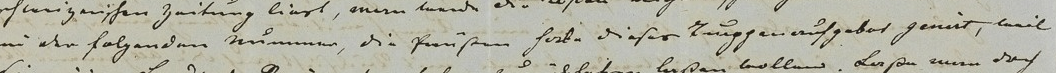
in der folgenden Nummer, die Preußen habe dieses Truppenaufgebot genirt, weil
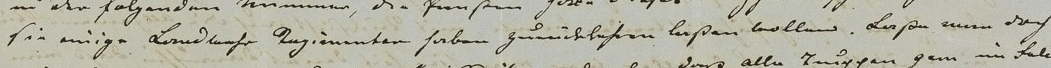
sie einige Landwehr Regimenter haben zurückkehren laßen wollen. Laße man doch
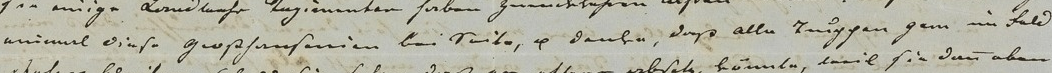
einmal diese Großhansereien bei Seite, u denke, daß alle Truppen gern im Feld
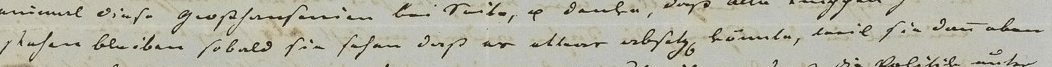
stehen bleiben sobald sie sehen daß es etwas absetzen könnte, weil sie dann eben
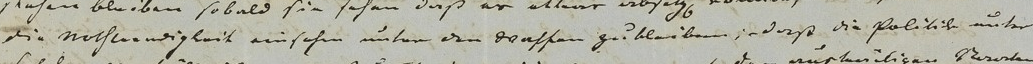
die Nothwendigkeit einsehen unter den Waffen zu bleiben; indeß die Politik unter
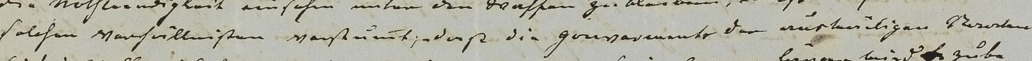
solchen Verhältnißen verstummt, daß die Gouvernemente der auswärtigen Staaten
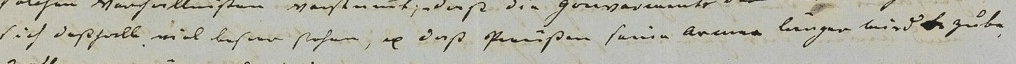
sich deßhalb viel besser stehen; u daß Preußen seine Armee länger wird ... zu be-
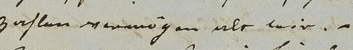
zahlen vermögen als wir. –
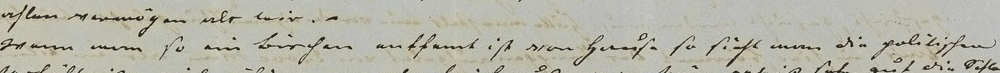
Wenn man so ein Bischen entfernt ist von Hause so sieht man die politischen
